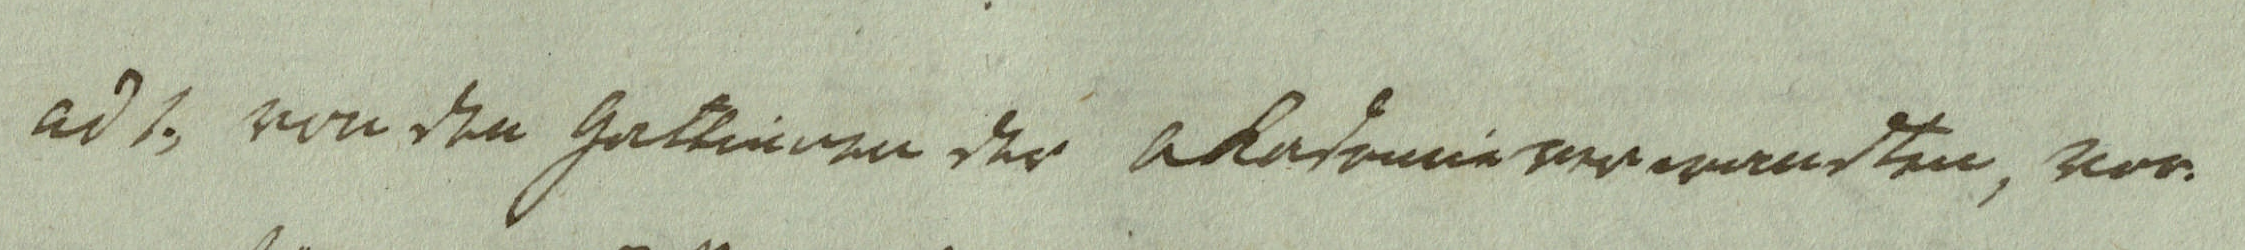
ad 1. von den Gattinnen der Akademieverwandten, vor¬
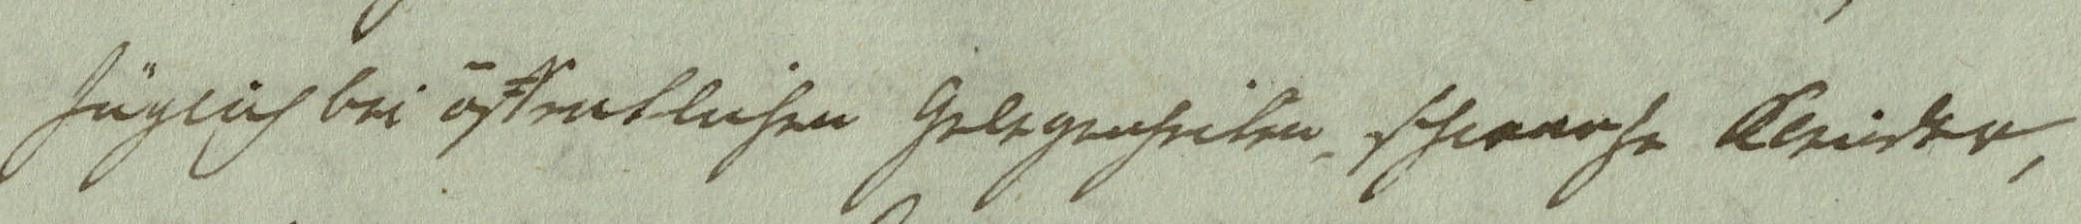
züglich bei öffentlichen Gelegenheiten schwarze Kleider,
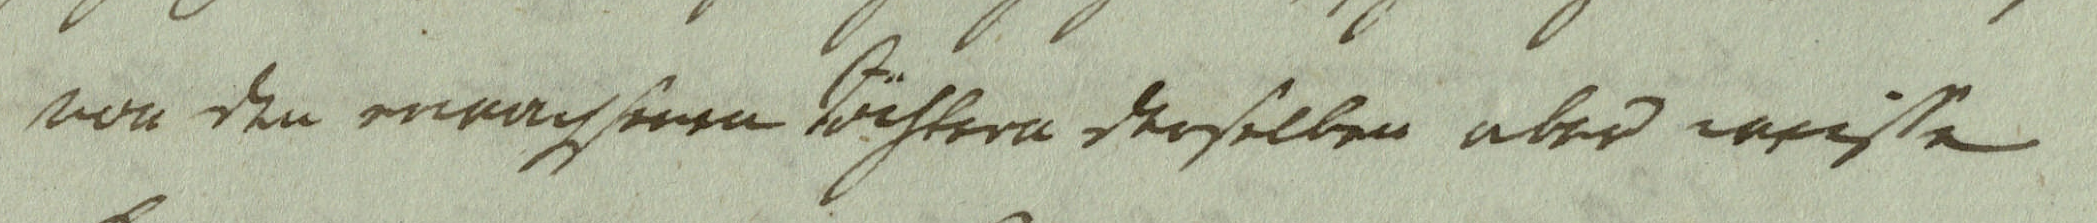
von den erwachsenen Töchtern derselben aber weiße
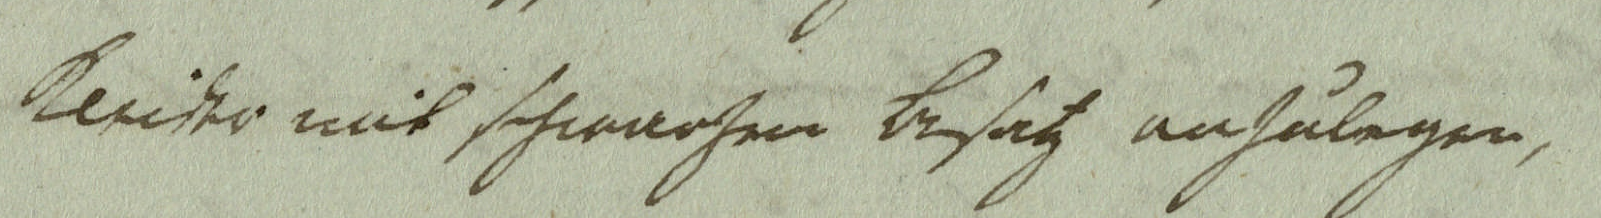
Kleider mit schwarzem Besatz anzulegen,
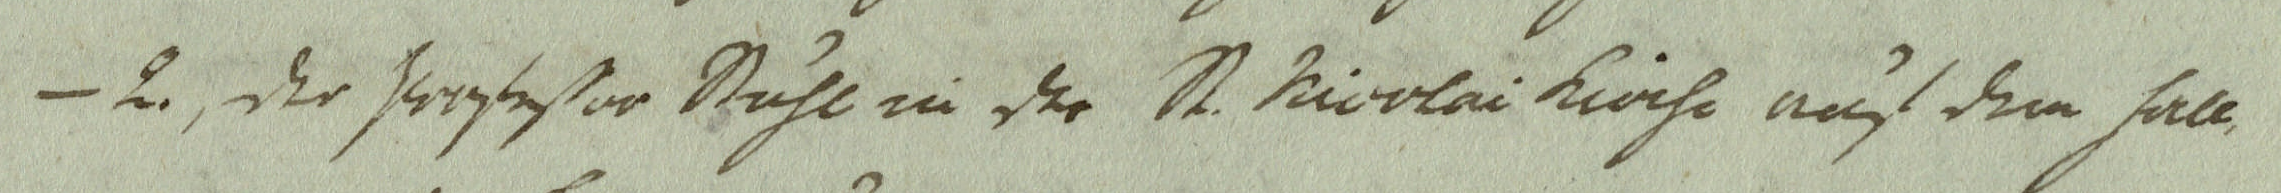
2. der Professor Stuhl in der St. Nicolai kirche auf dem Fall
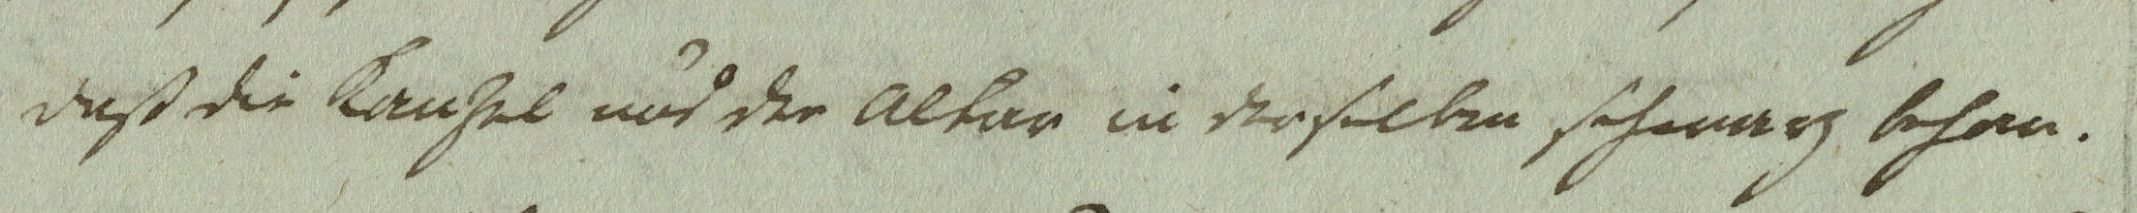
daß die Kanzel und der Altar in derselben schwarz behan¬
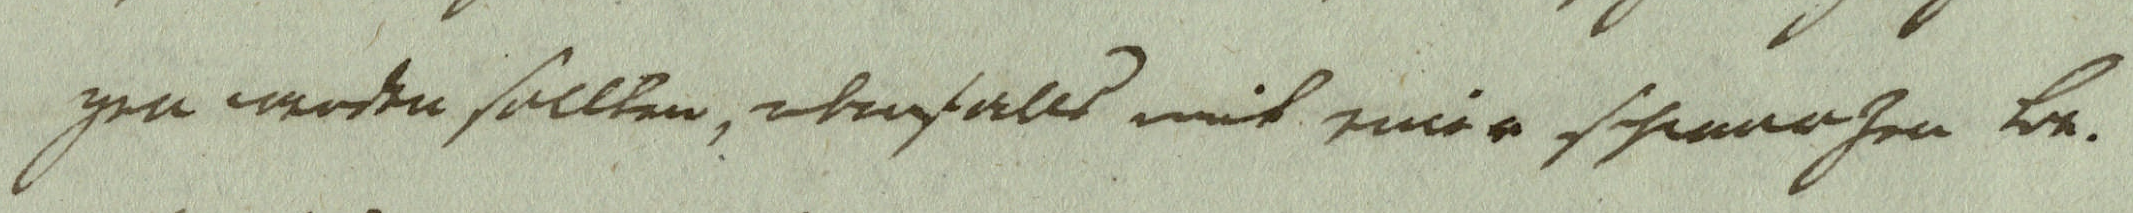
gen werden sollten, ebenfalls mit einer schwarzen Be¬
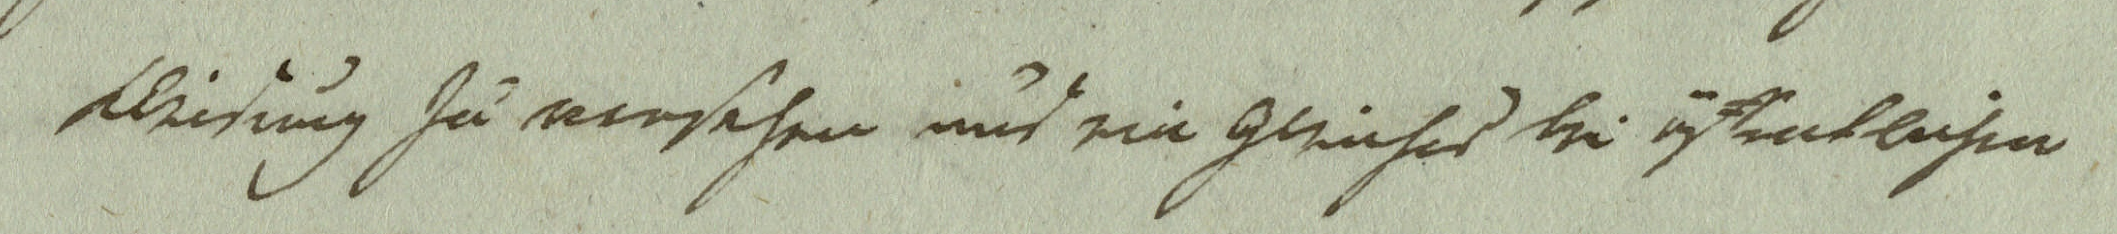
kleidung zu versehen und ein gleiches bei öffentlichen
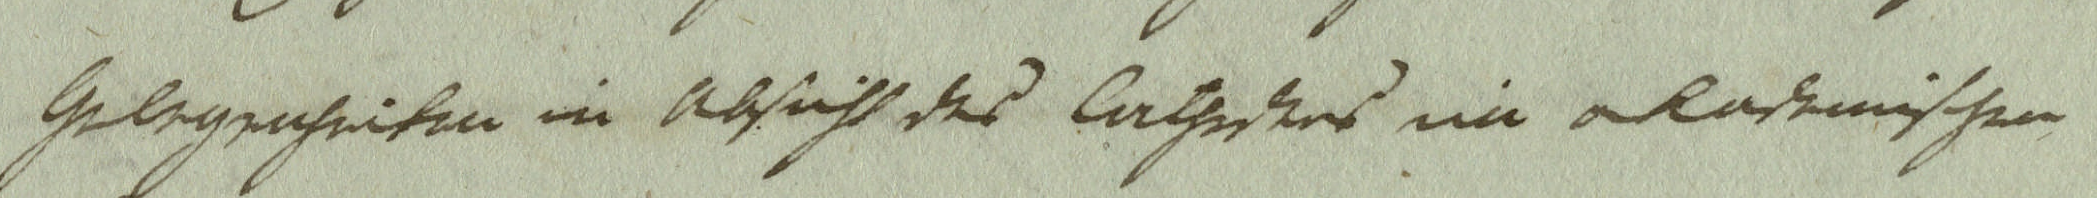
Gelegenheiten in Absicht des Catheders im akademischen
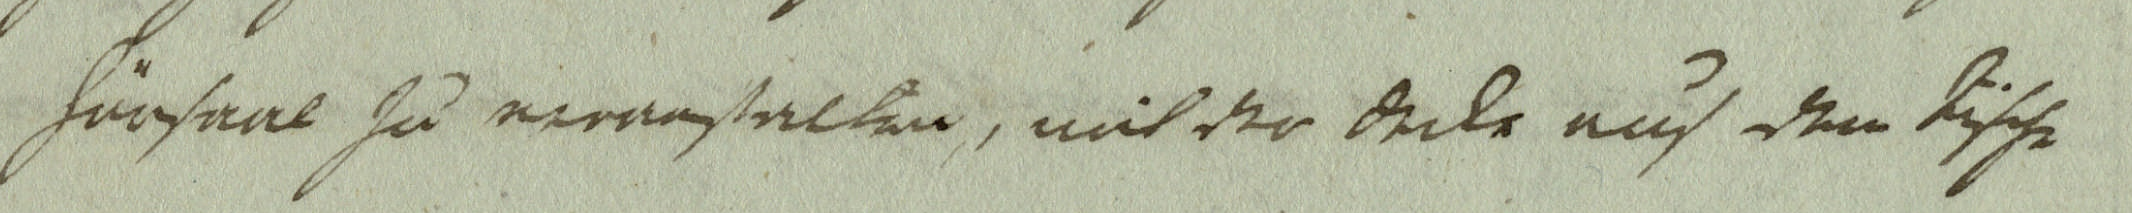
Hörsaal zu veranstalten, mit der Decke auf dem Tische
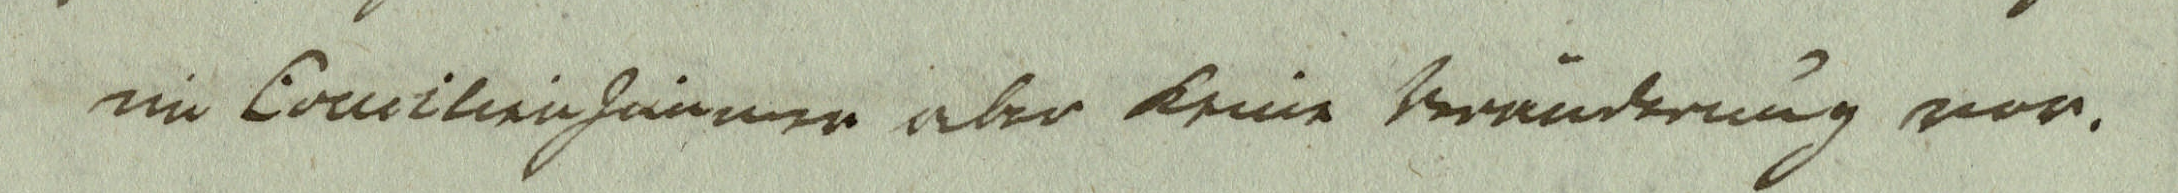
im Concilienzimmer aber keine Veränderung vor¬
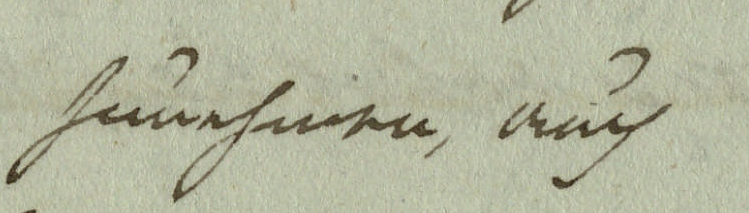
zunehmen, auch
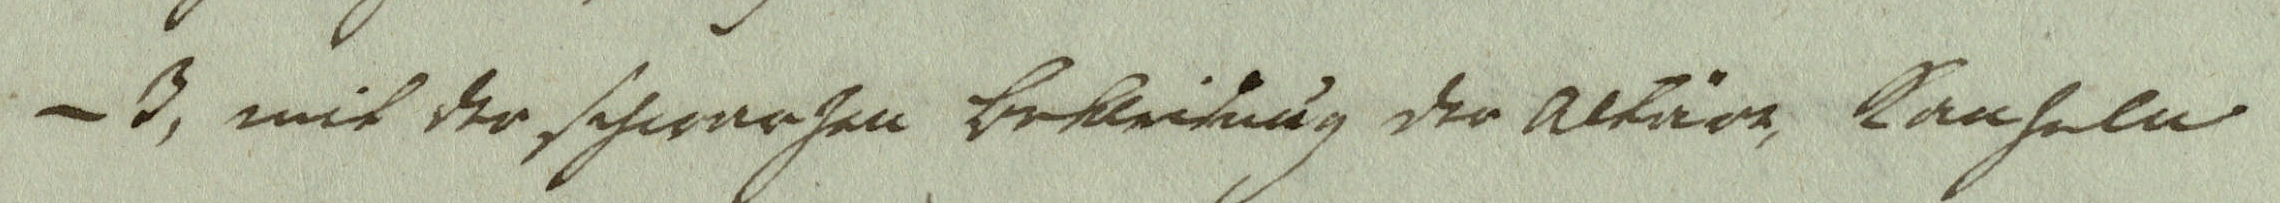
3. mit der schwarzen Bekleidung der Altäre, Kanzeln
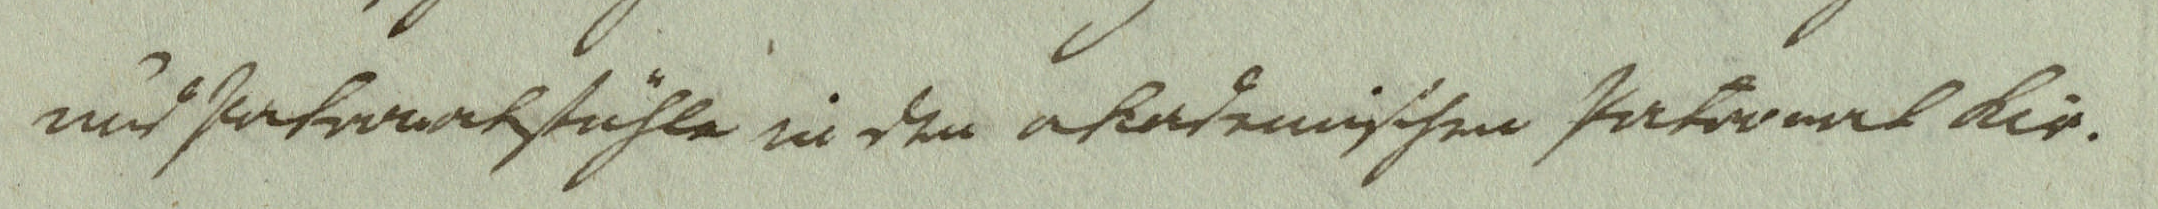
und Patronatstühle in den akademischen Patronat kir¬
